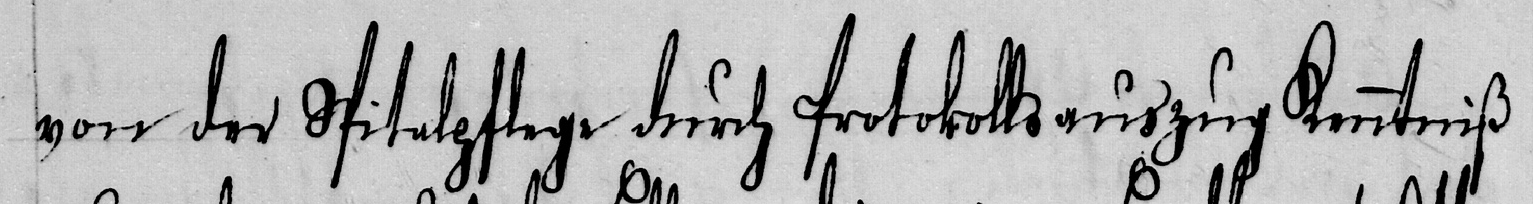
von der Spitalpflege durch Protokollsauszug Kenntniß
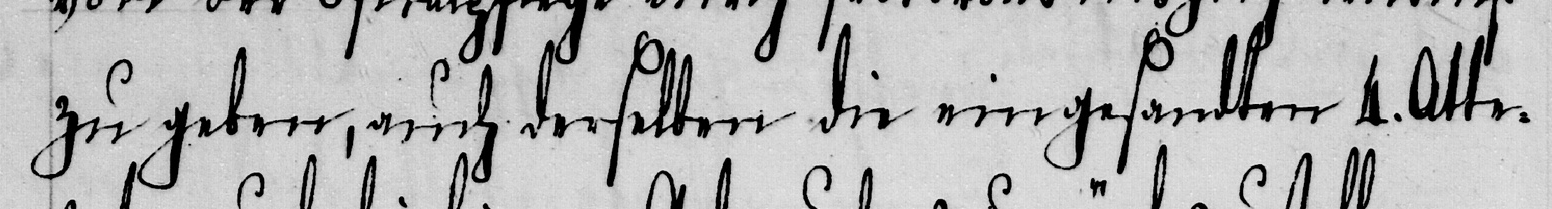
zu geben, auch derselben die eingesandten 4. Atte¬
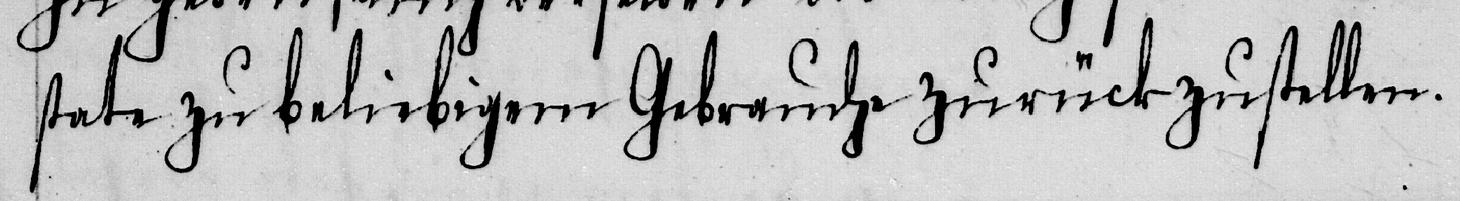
state zu beliebigem Gebrauche zurückzustellen.
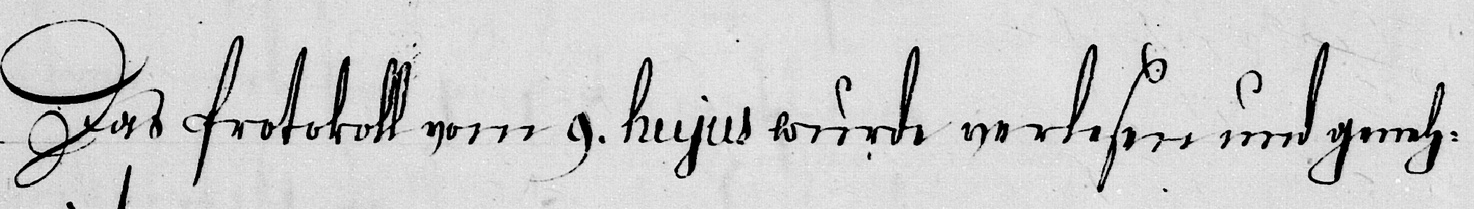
Das Protokoll vom 9. hujus wurde verlesen und geneh¬
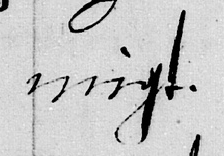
migt.
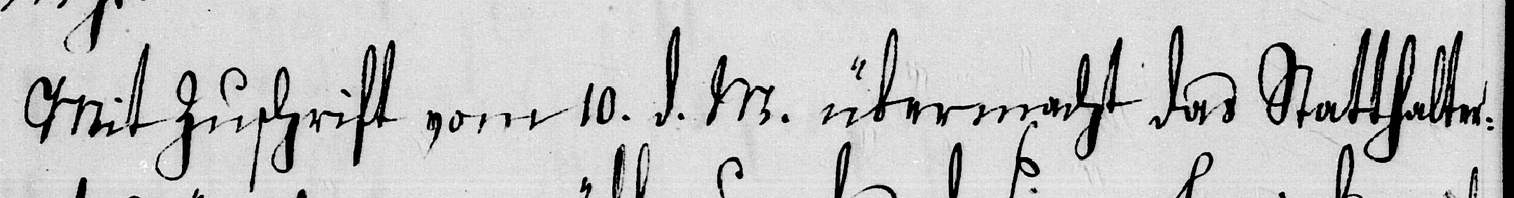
Mit Zuschrift vom 10. d. M. übermacht das Statthalt¬
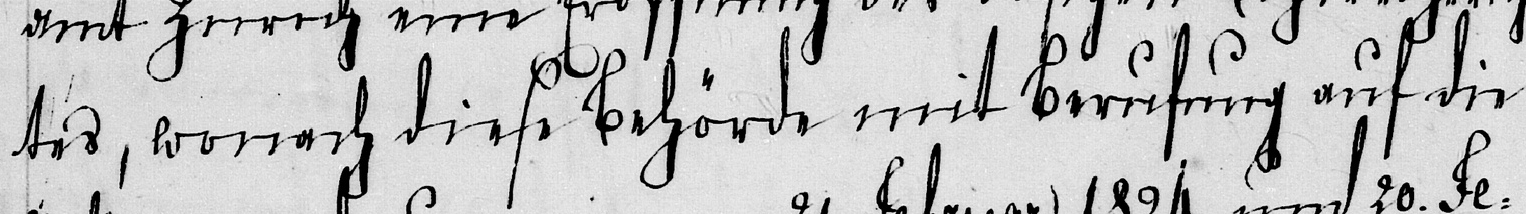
tes, wodurch diese Behörde mit Berufung auf die
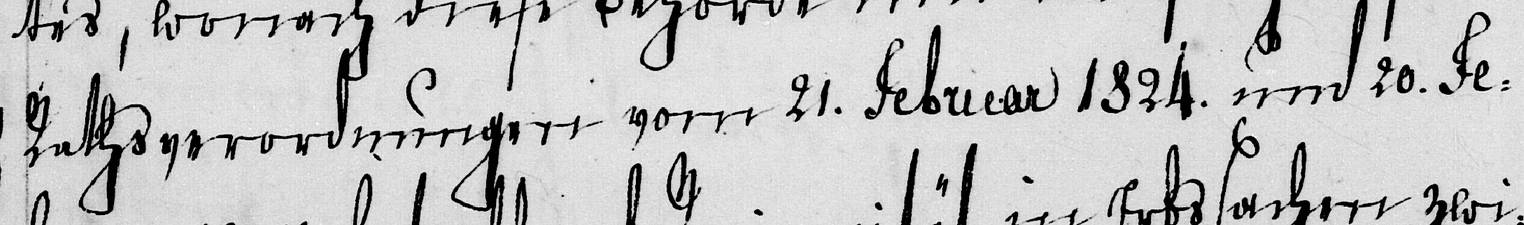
Rathsverordnungen vom 21. Februar 1824. und 20. Fe¬
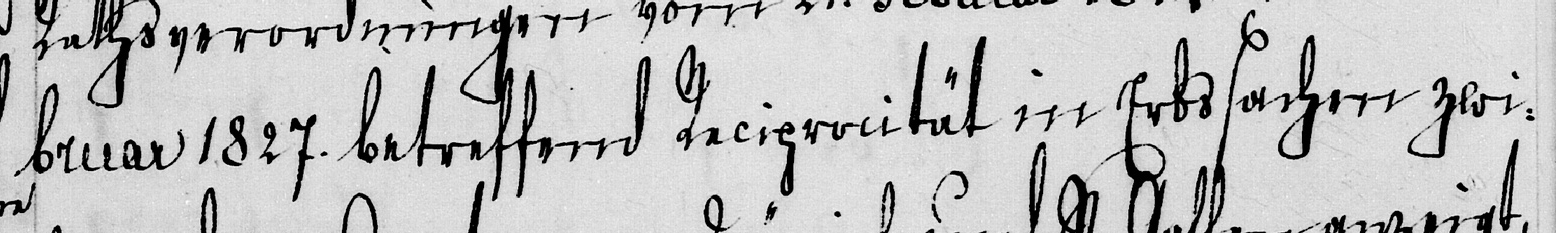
bruar 1827. betreffend Reciprocität in Erbssachen zwi¬
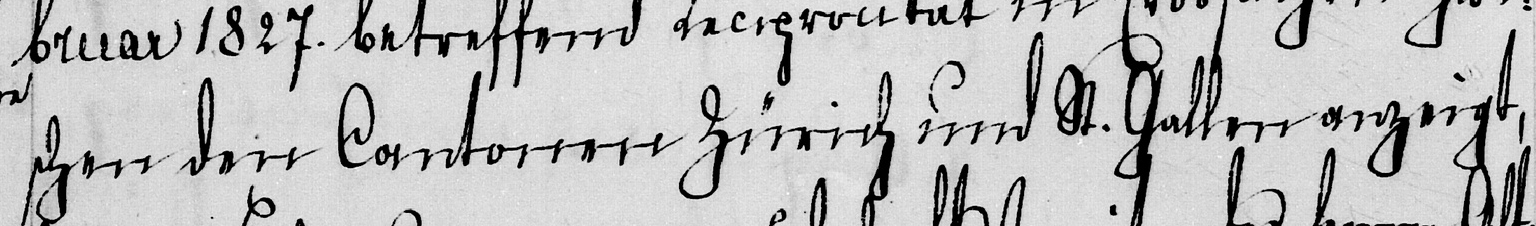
schen den Cantonen Zürich und St. Gallen anzeigt,
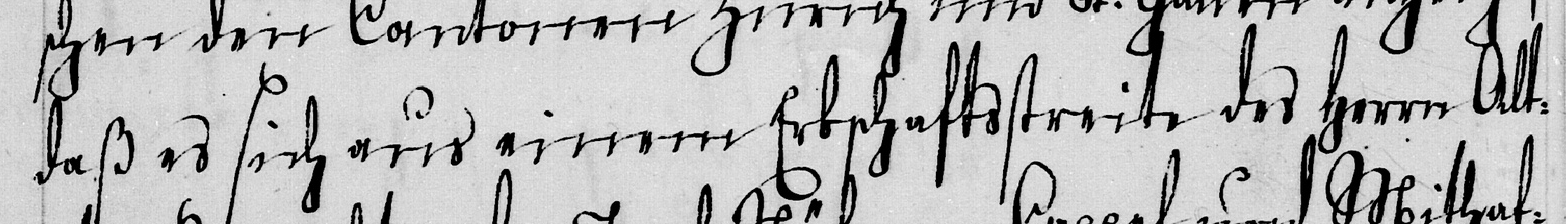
daß es sich aus einem Erbschaftsstreite des Herrn Al¬
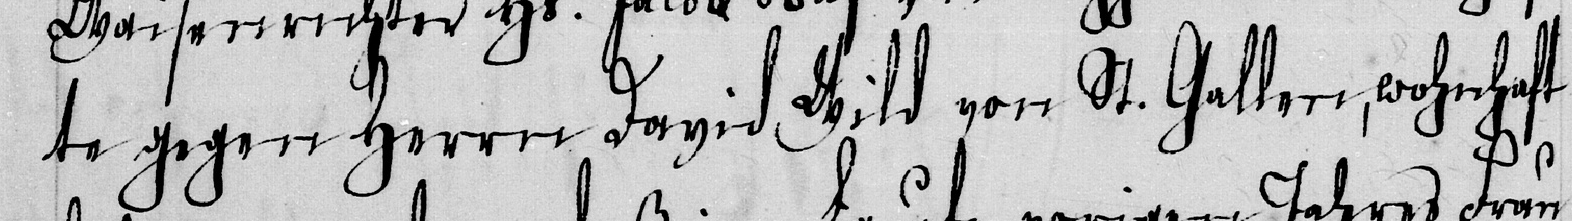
te gegen Herrn David Wild von St. Gallen, wohnhaft
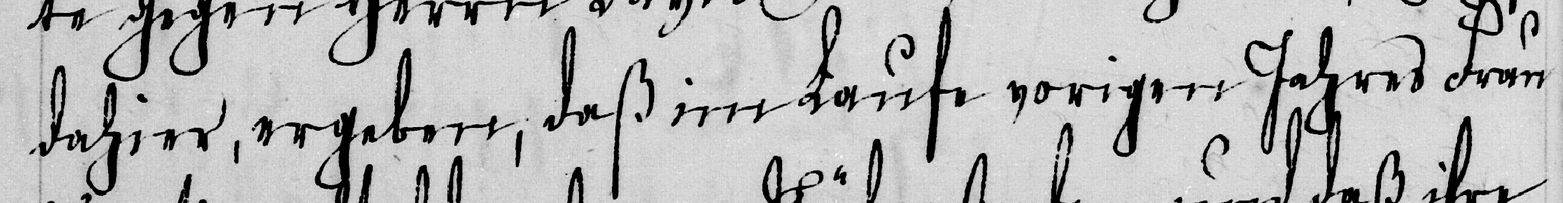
dahier, ergaben, daß im Laufe vorigen Jahres Frau
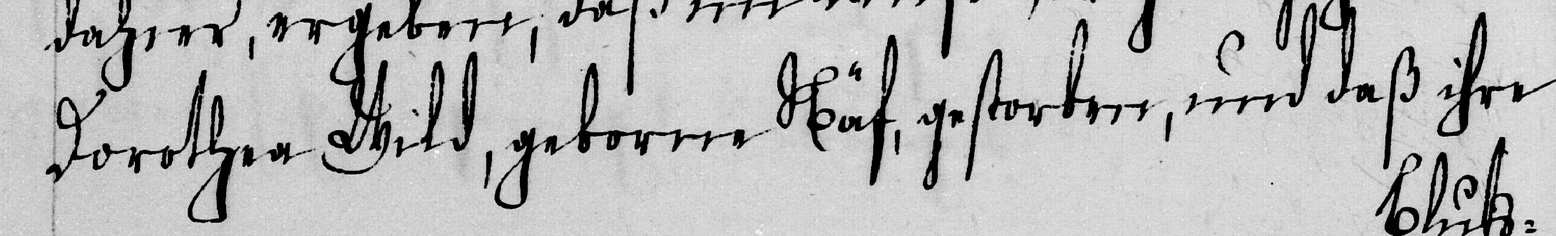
Dorothea Wild, geborne Näf, gestorben, und daß ihre
